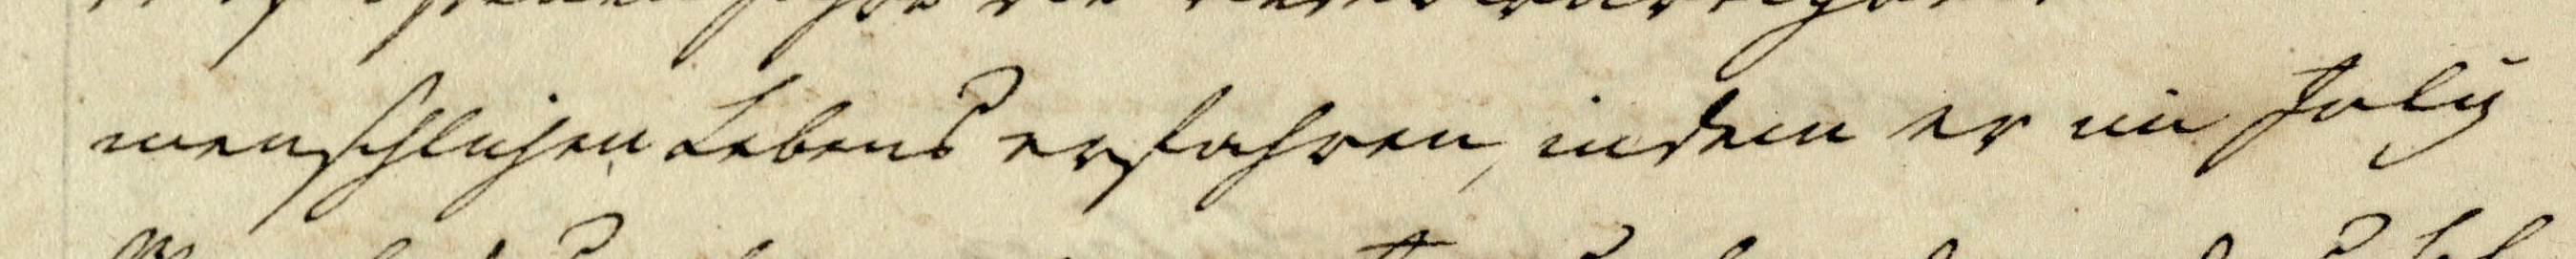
menschlichen Lebens erfahren, indem er im Julÿ
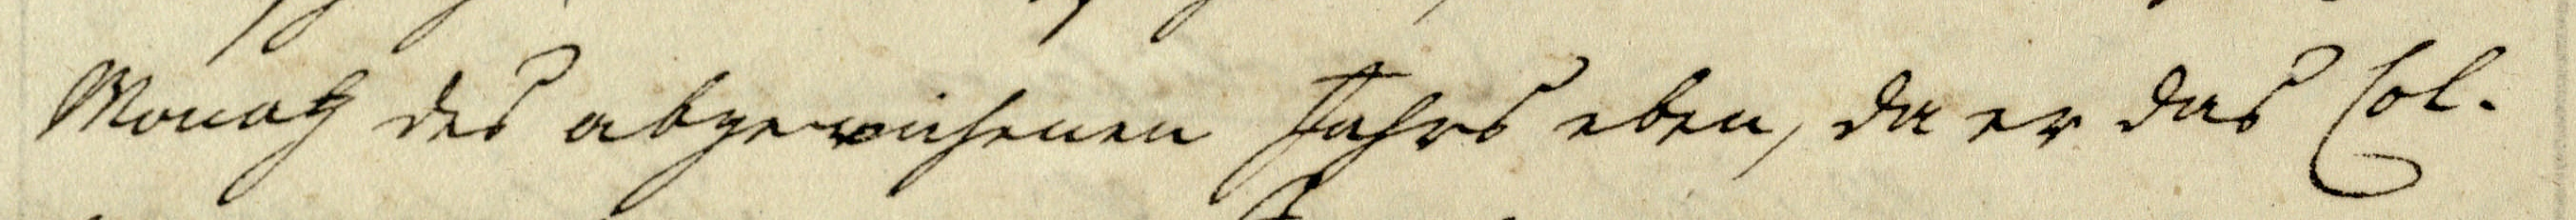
Monath des abgewichenen Jahrs eben, da er das Col¬
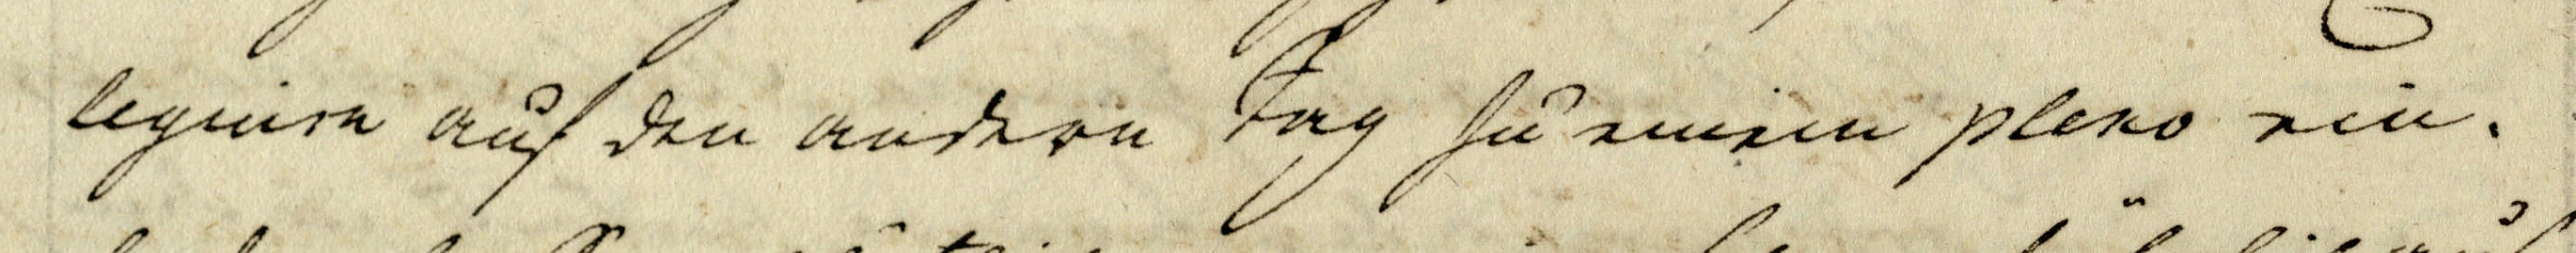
legium auf den andern Tag zu einem pleno ein¬
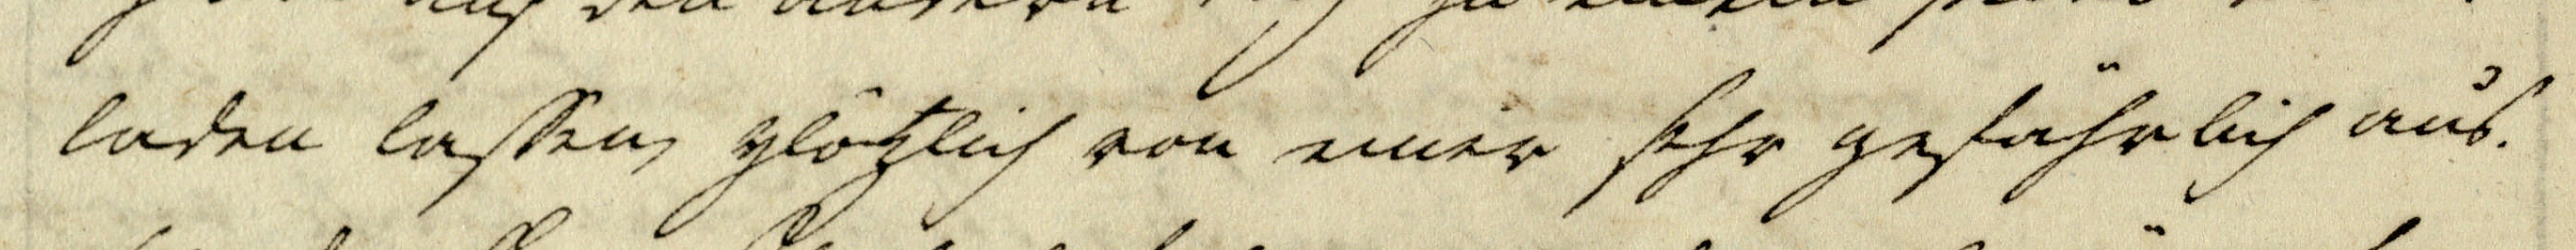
laden lassen, plötzlich von einer sehr gefährlich aus¬
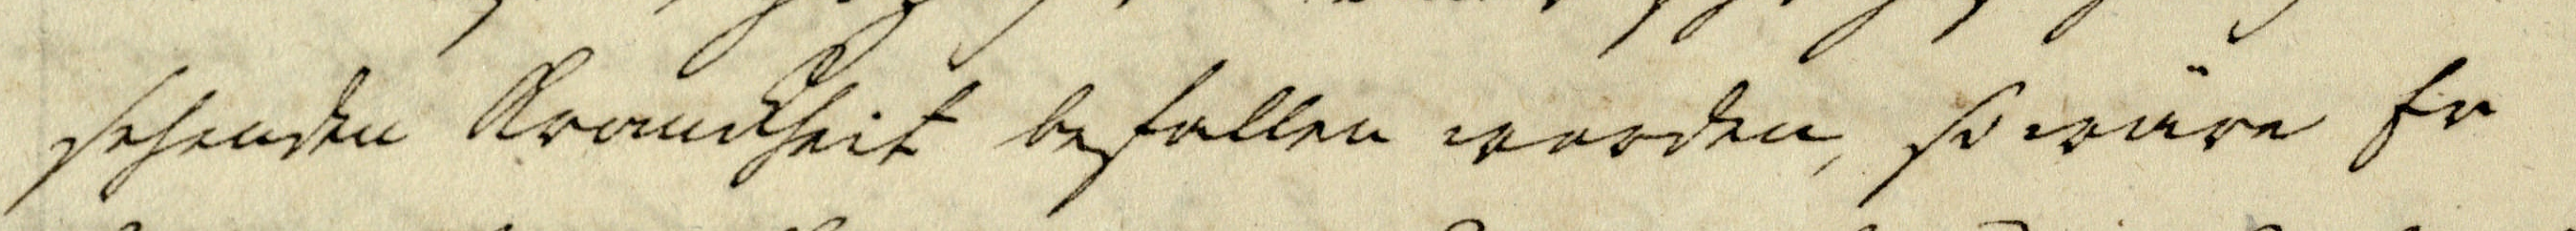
sehenden Kranckheit befallen worden, so wäre Er
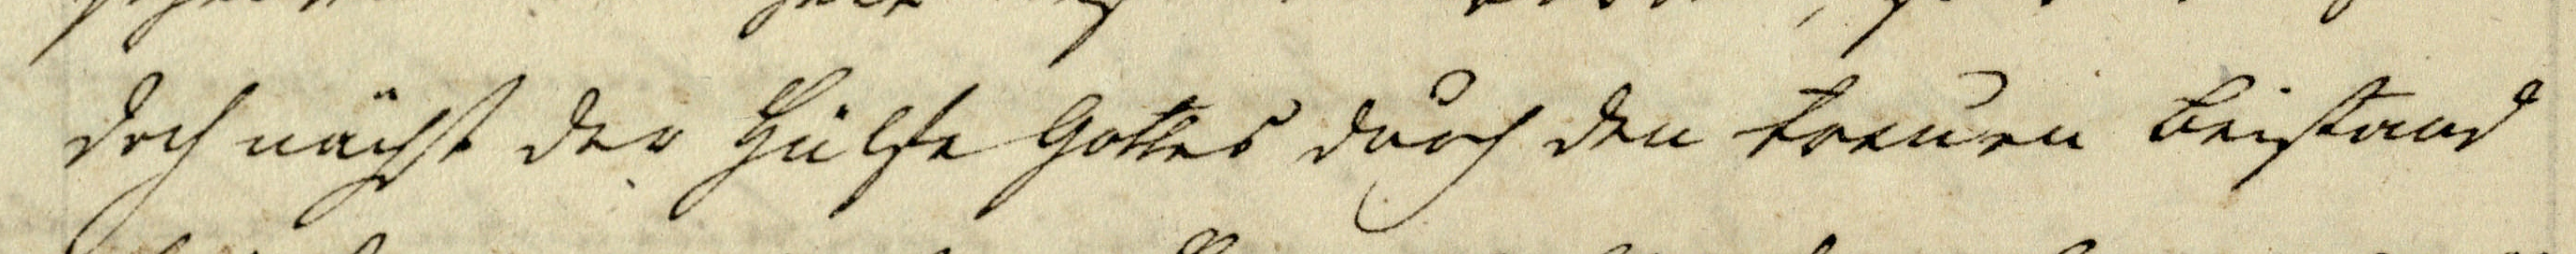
doch nächst der Hülfe Gottes durch den treuen Beistand
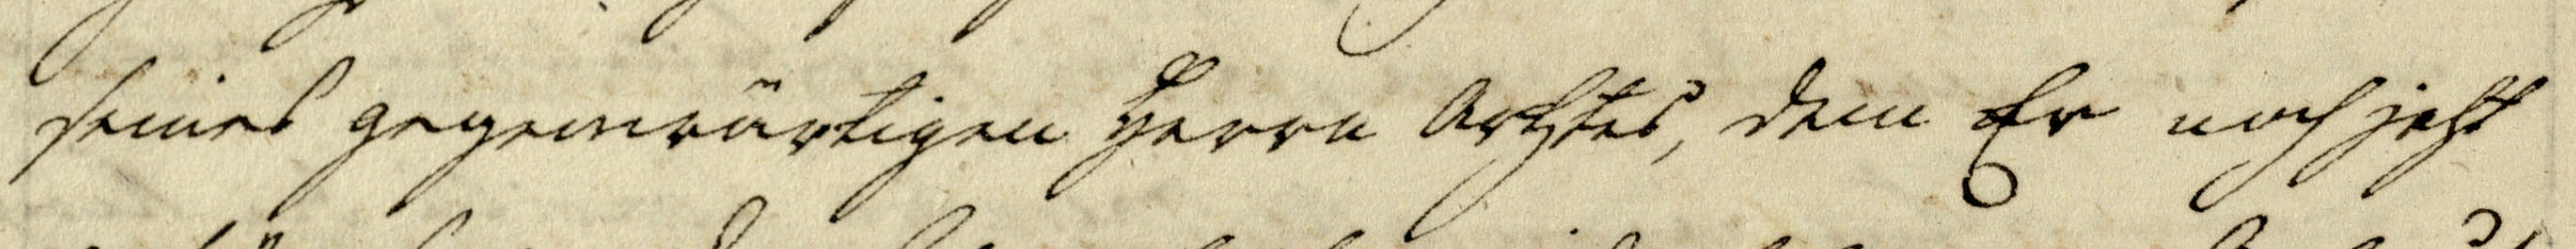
seines gegenwärtigen Herrn Arztes, dem Er noch jetzt
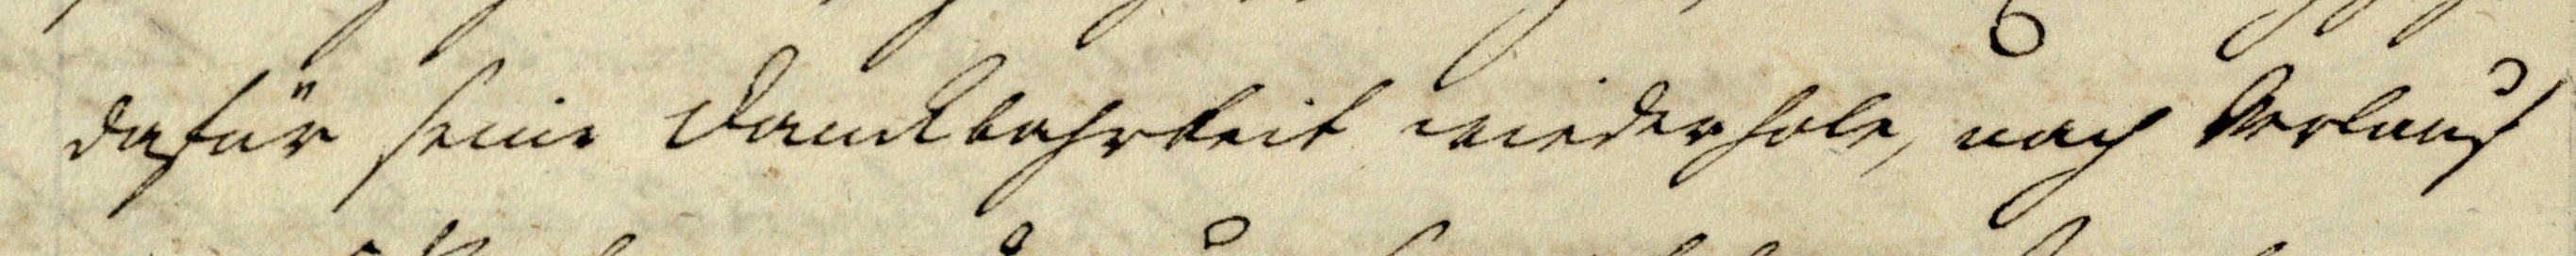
dafür seine Danckbahrkeit wiederhole, nach Verlauf
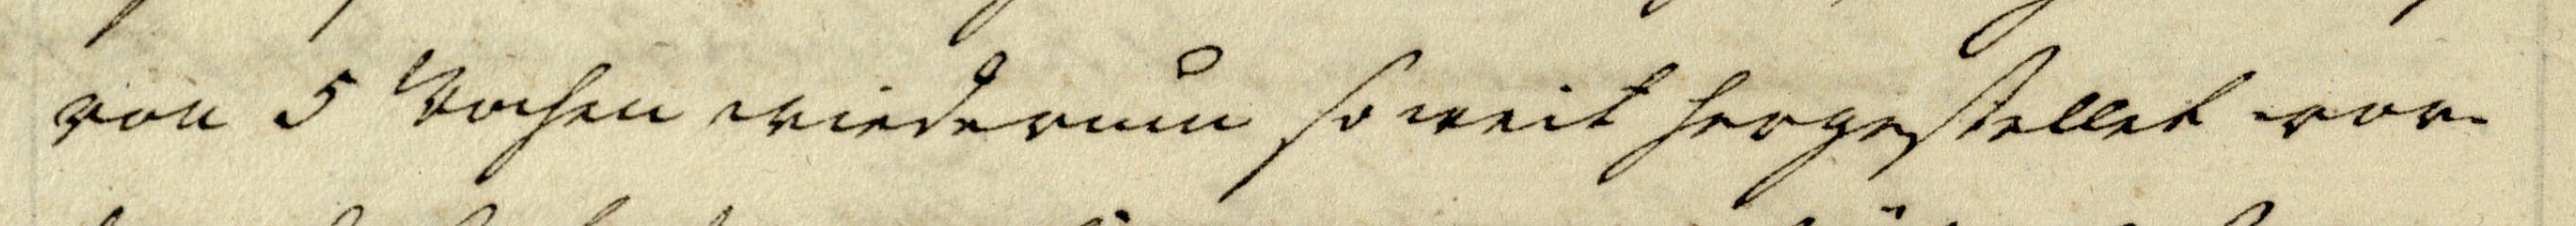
von 5 Wochen wiederum so weit hergestellet wor¬
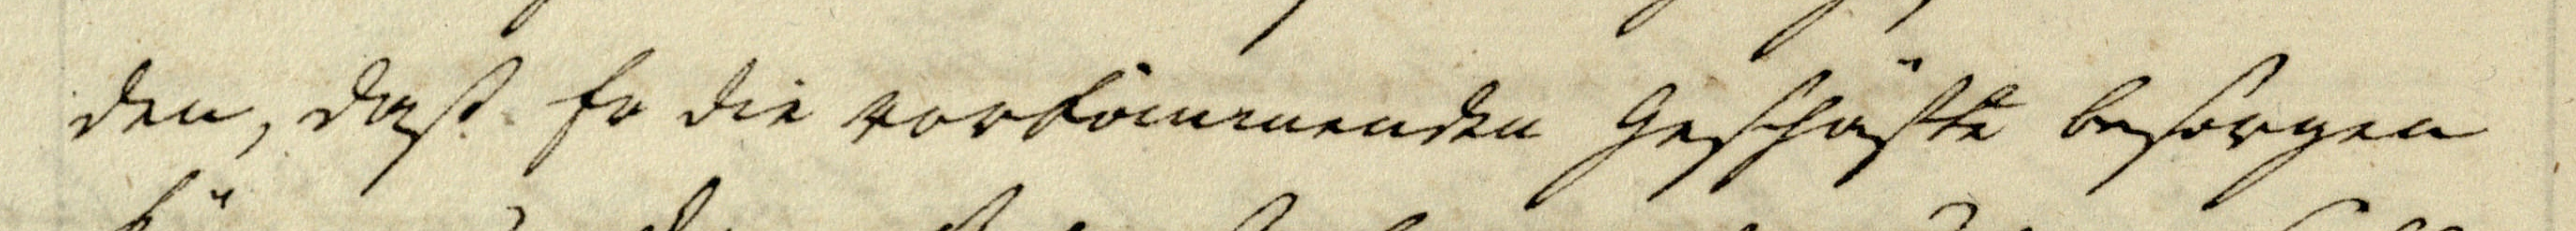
den, daß Er die vorkommenden Geschäfte besorgen
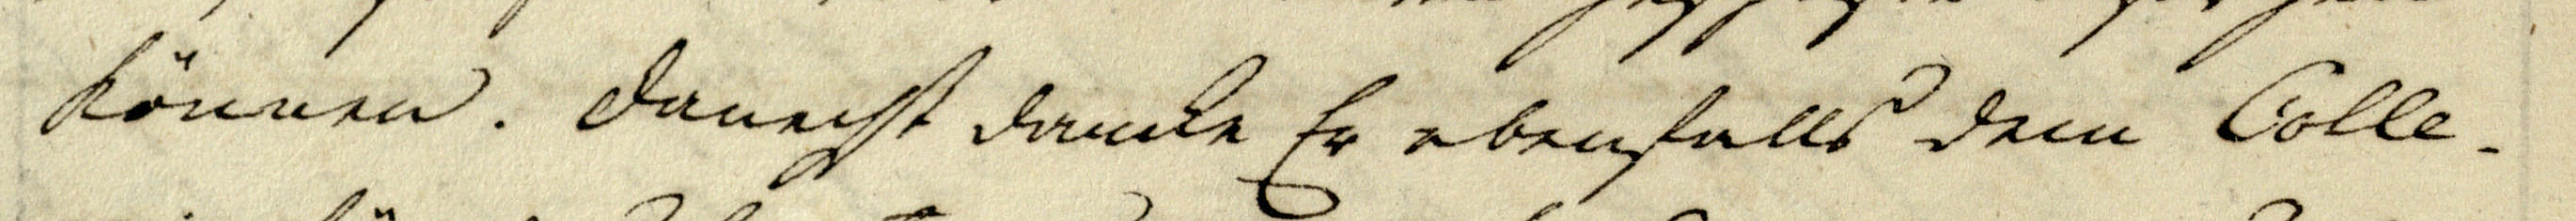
können. Danechst dancke Er ebenfalls dem Colle¬
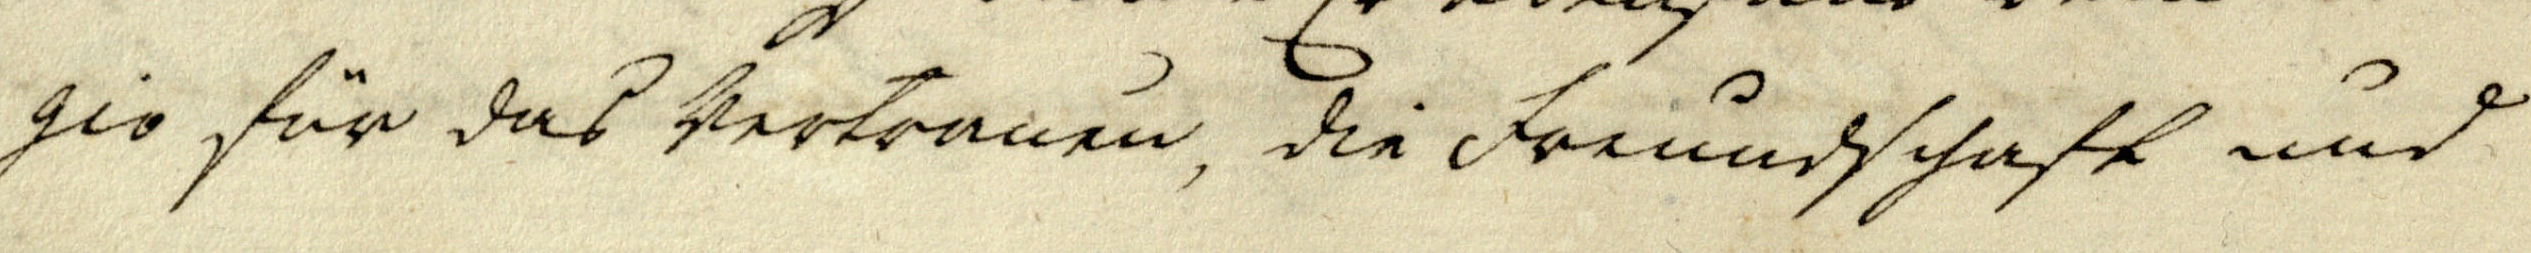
gio für das Vertrauen, die Freundschaft und
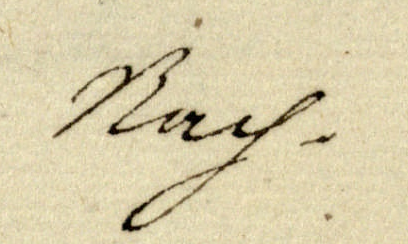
Nach.
